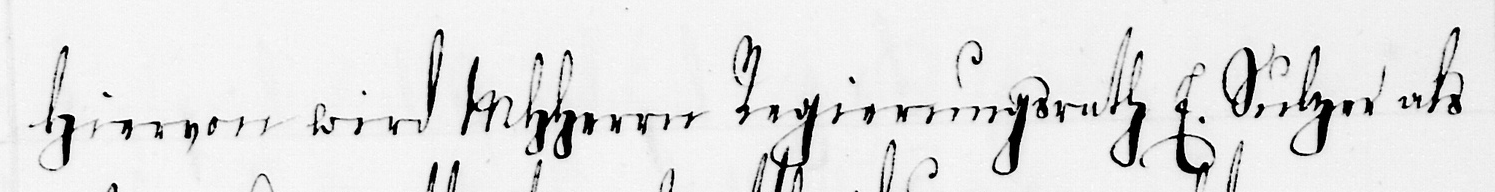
Hiervon wird MHHerrn Regierungsrath E. Sulzer als
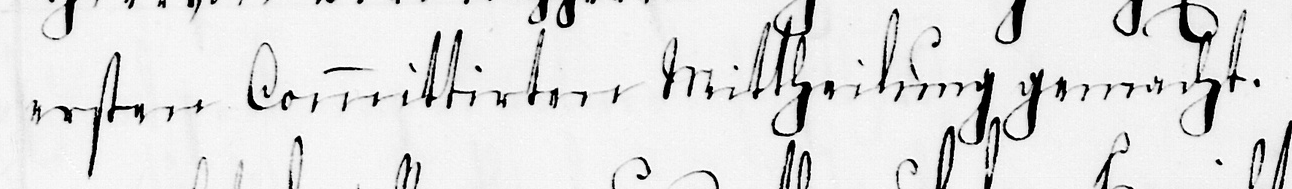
ersten Committirten Mittheilung gemacht.
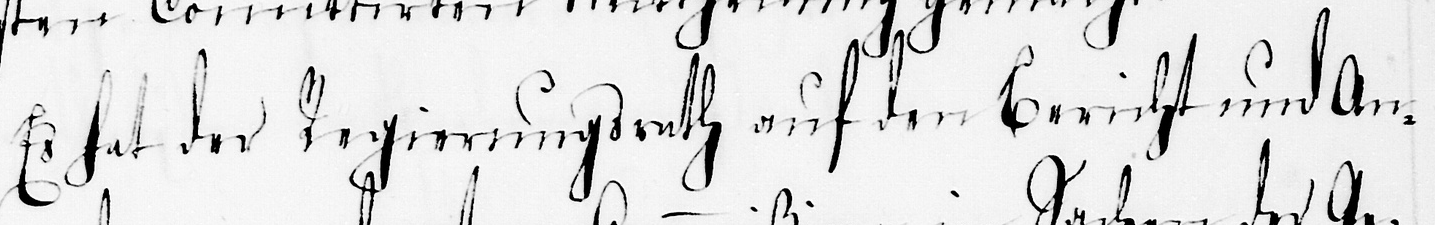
Es hat der Regierungsrath auf den Bericht und An¬
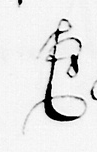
C.)
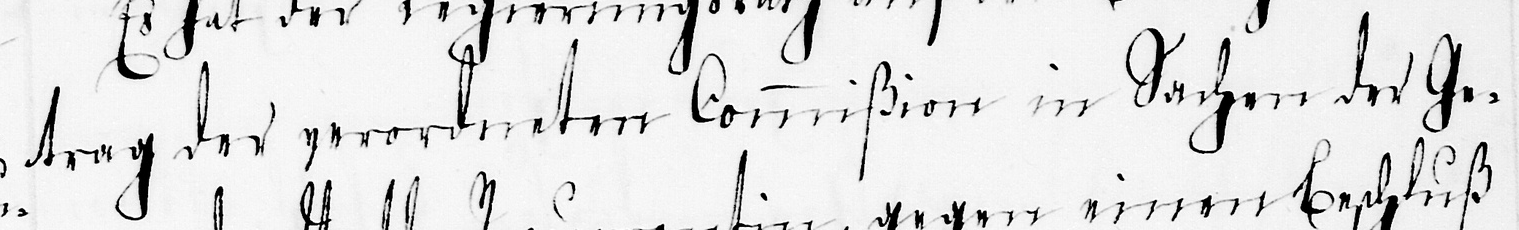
trag der verordneten Commißion in Sachen der Ge¬
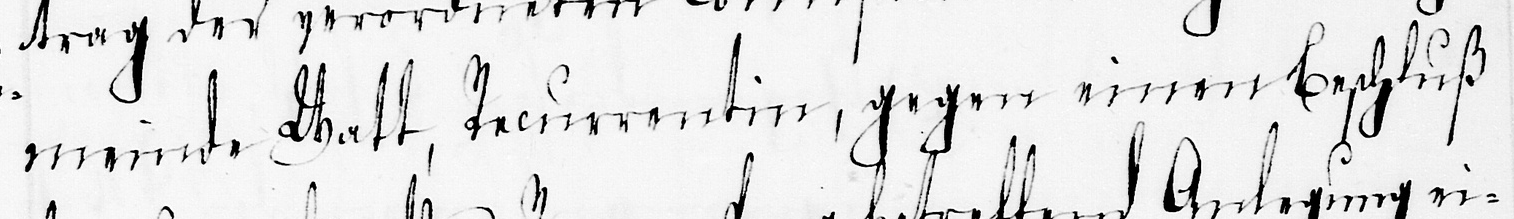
meinde Watt, Recurrentin, gegen einen Beschluß
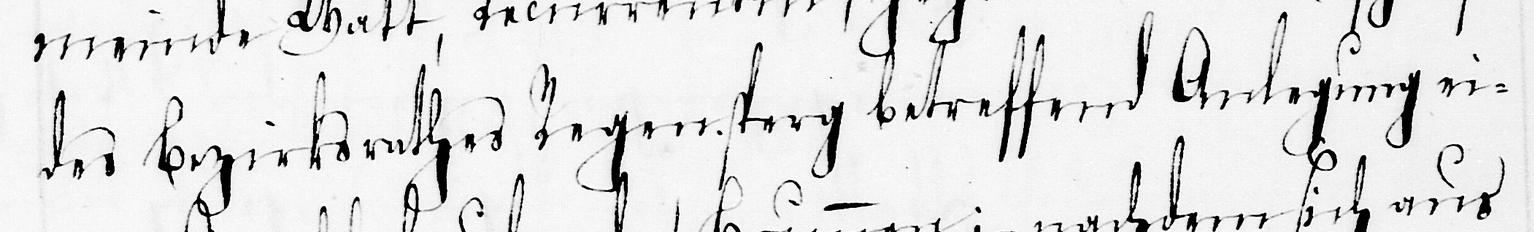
des Bezirksrathes Regensperg betreffend Anlegung ei¬
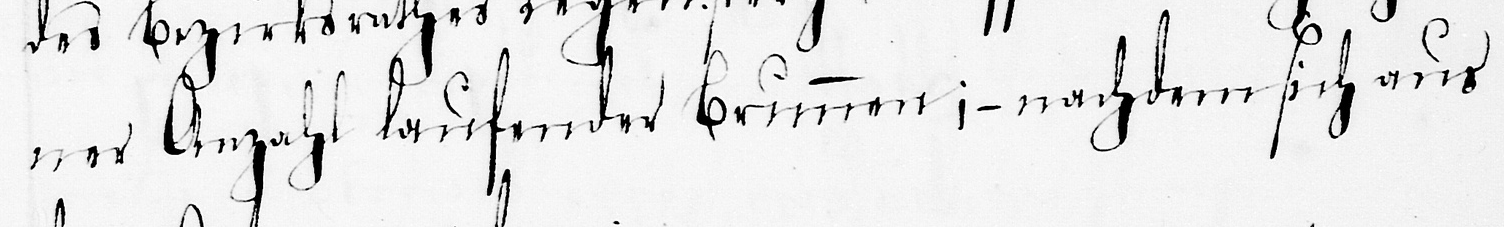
ner Anzahl laufender Brunnen; – nachdem sich aus
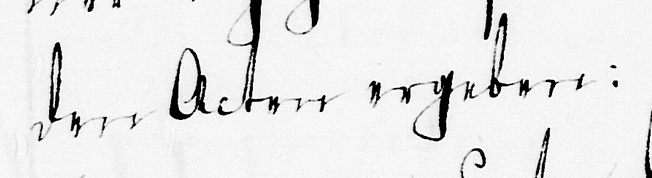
den Acten ergeben:
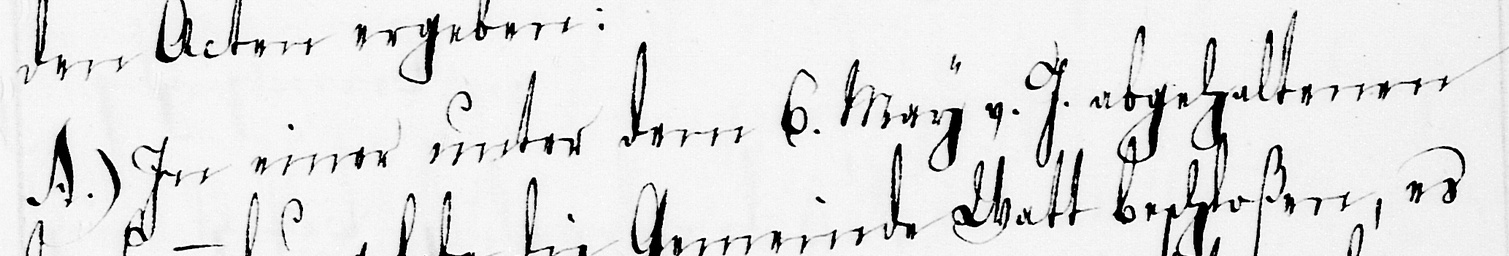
A.) In einer unter dem 6. May v. J. abgehaltenen
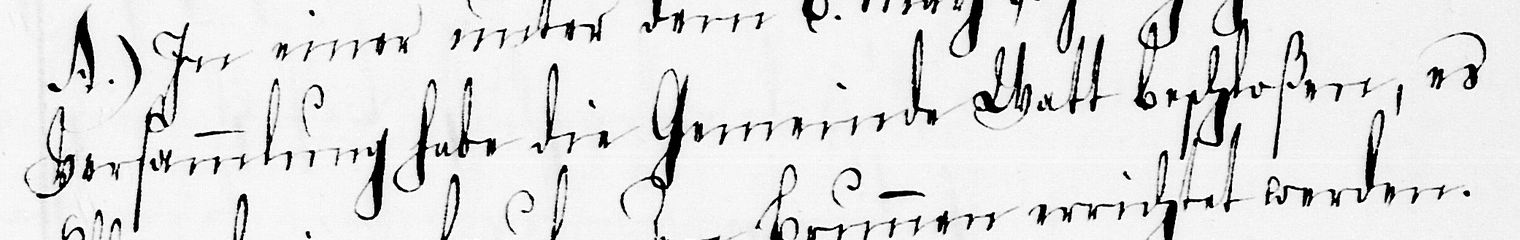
Versammlung habe die Gemeinde Watt beschloßen, es
